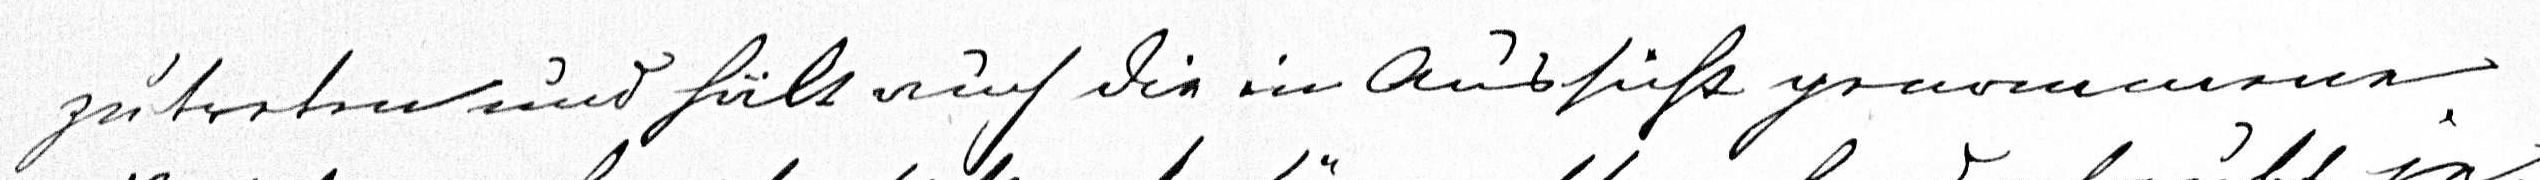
zutreten und hält auch die in Aussicht genomene
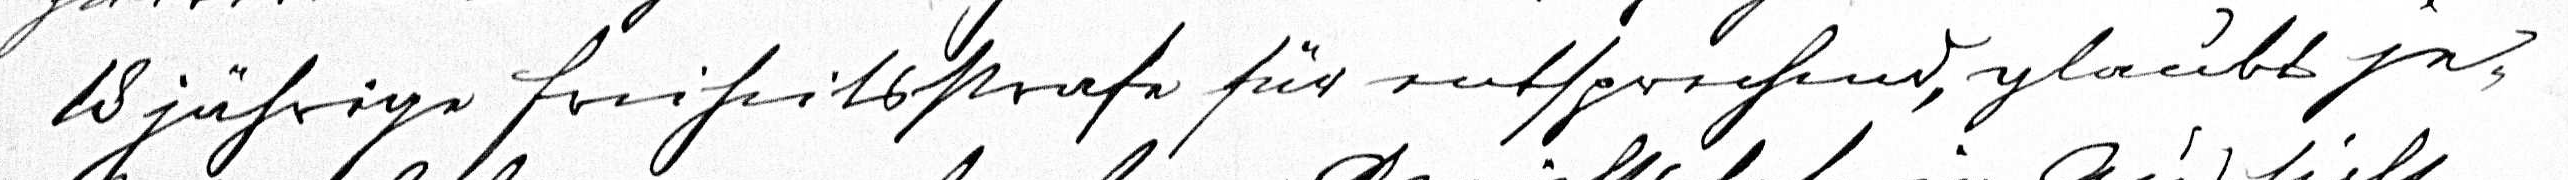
18jährige Freiheitsstrafe für entsprechend, glaubt je¬
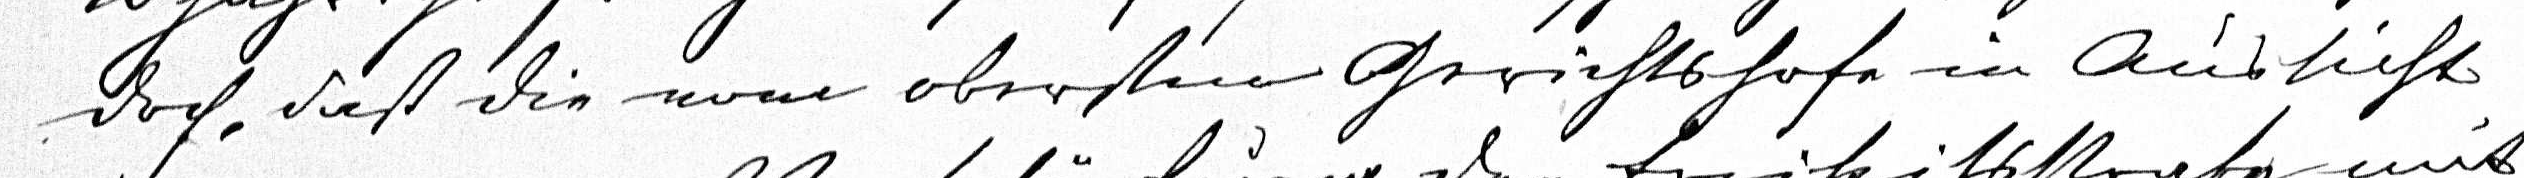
doch, daß die vom obersten Gerichtshof in Aussicht
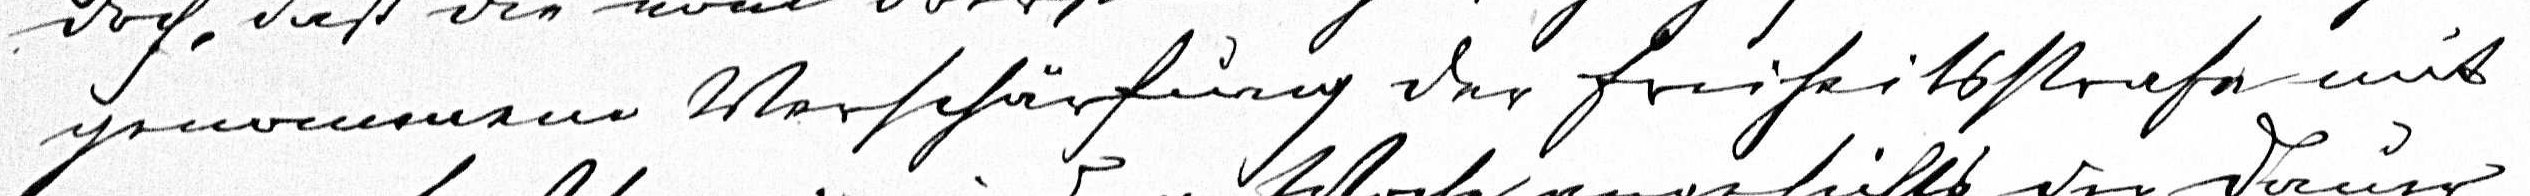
genommene Verschärfung der Freiheitsstrafe mit
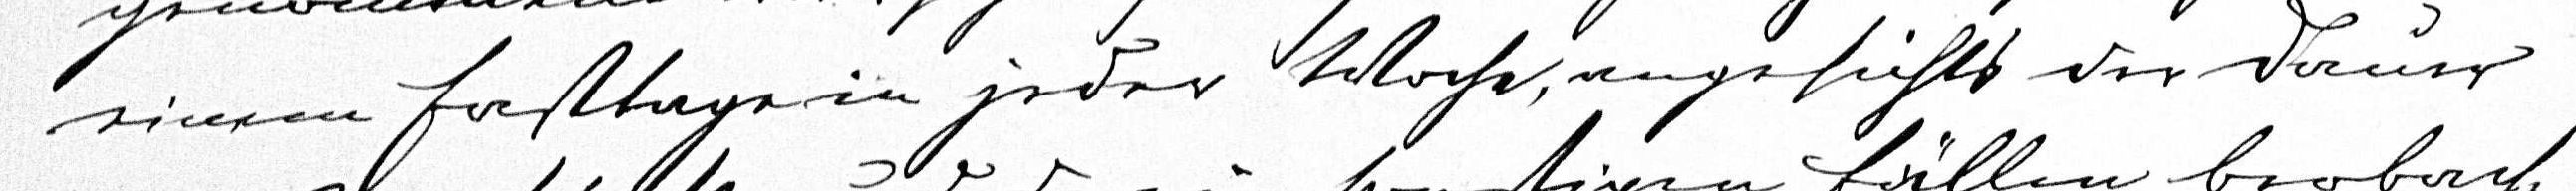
einem Fastage in jeder Woche, angesichts der Dauer
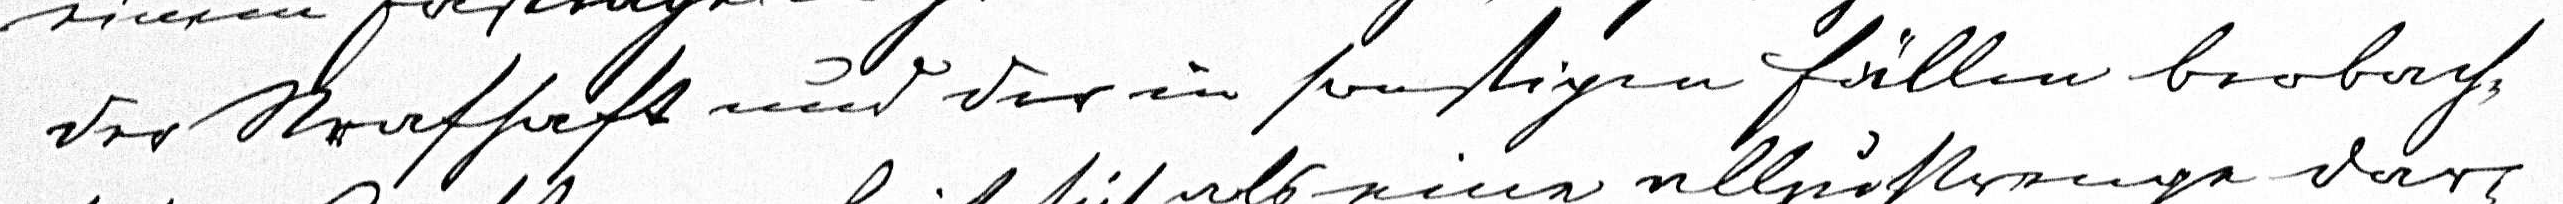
der Strafhaft und der in sonstigen Fällen beobach¬
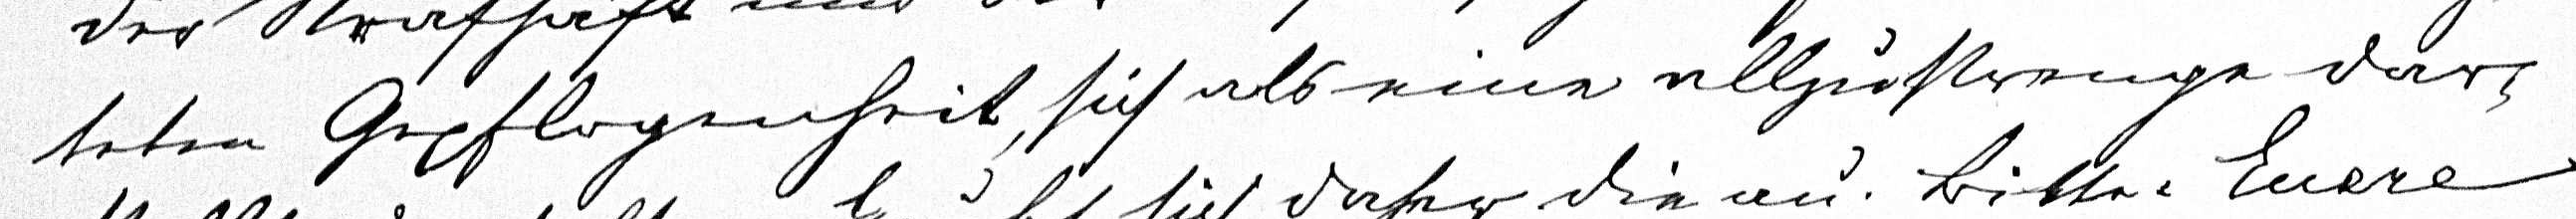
teten Gepflogenheit, sich als eine allzustrenge dar¬
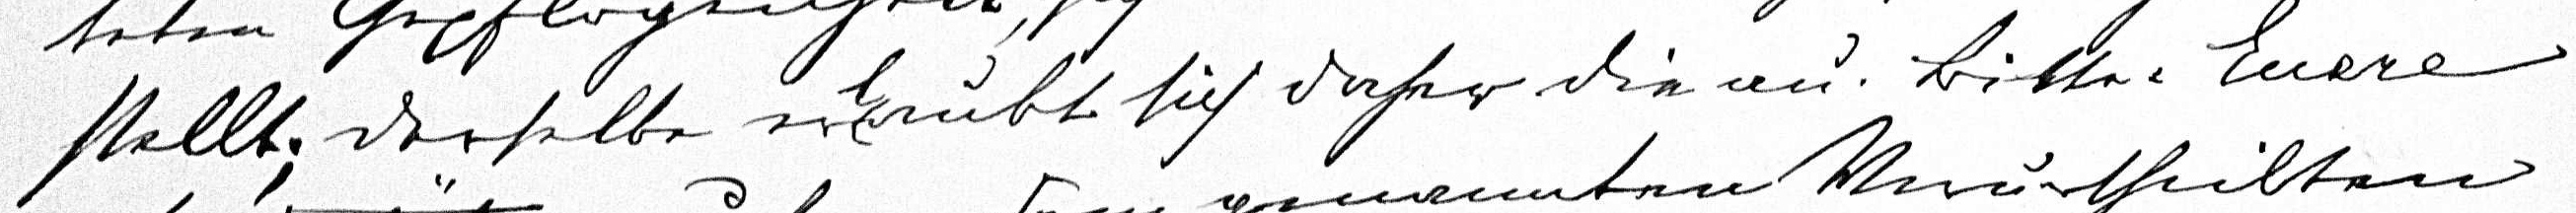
stellt; derselbe erlaubt sich daher die au. Bitte Euere
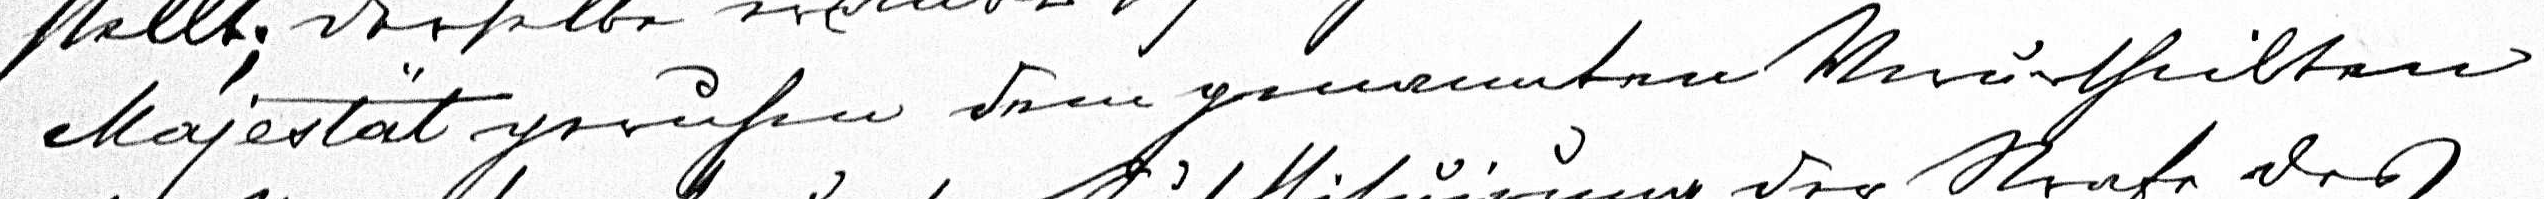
Majestät geruhen dem genannten Verurtheilten
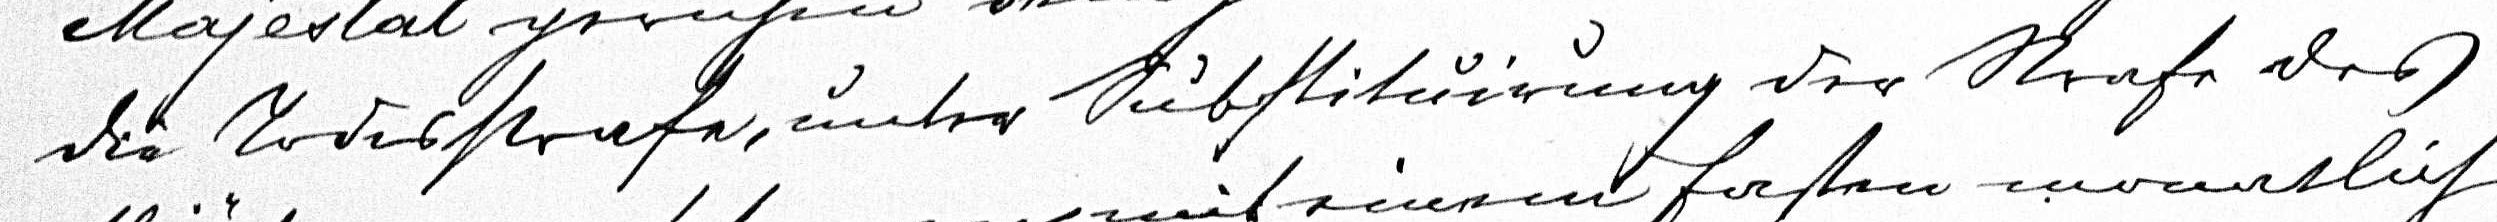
die Todesstrafe, unter Substituirung der Strafe des
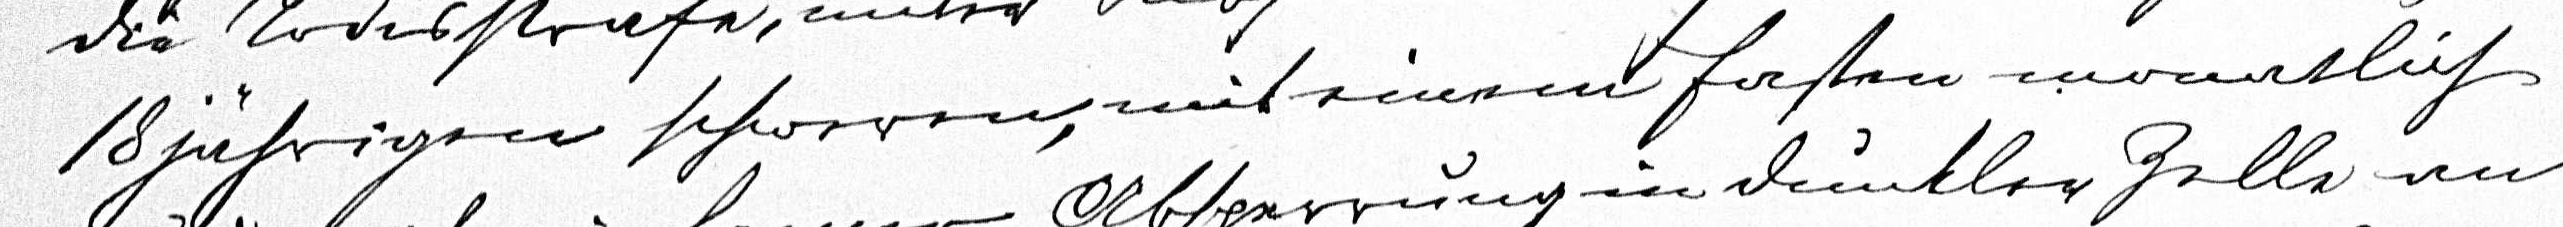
18jährigen schweren, mit einem Fasten monatlich
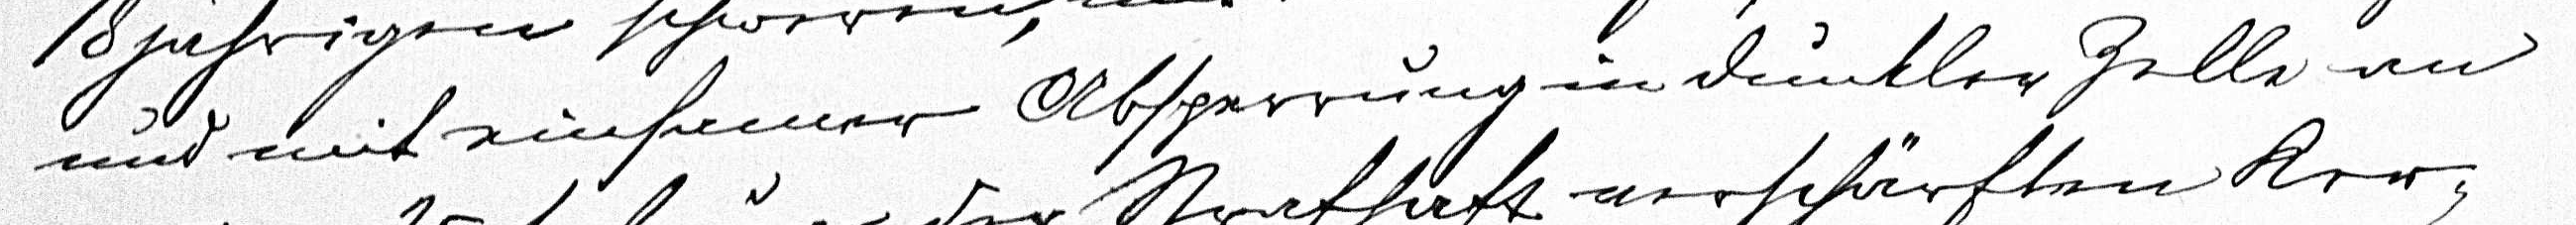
und mit einsamer Absperrung in dunkler Zelle an
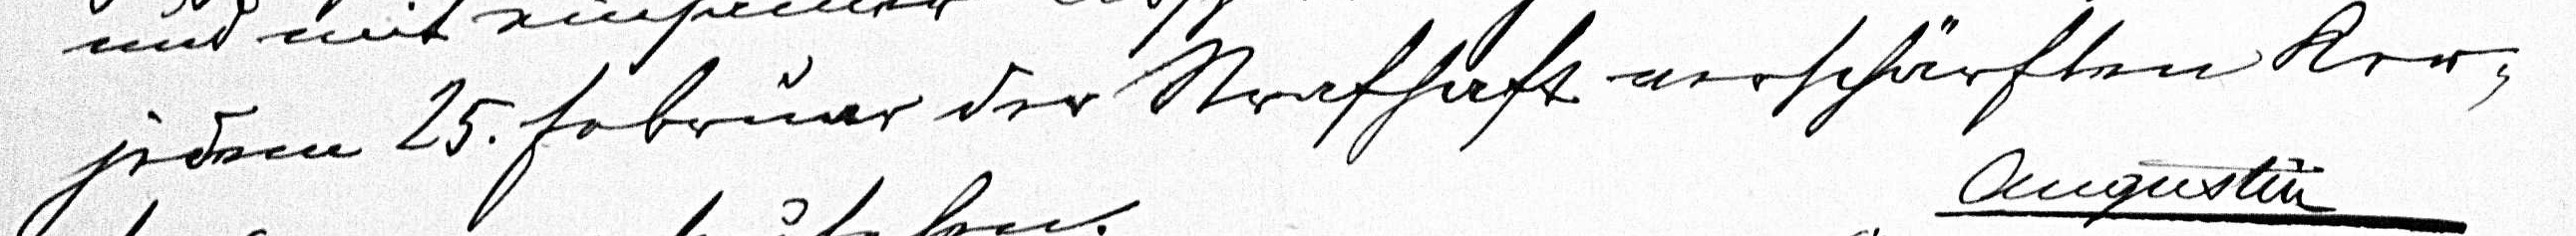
jedem 25. Februar der Strafhaft verschärfter Ker¬
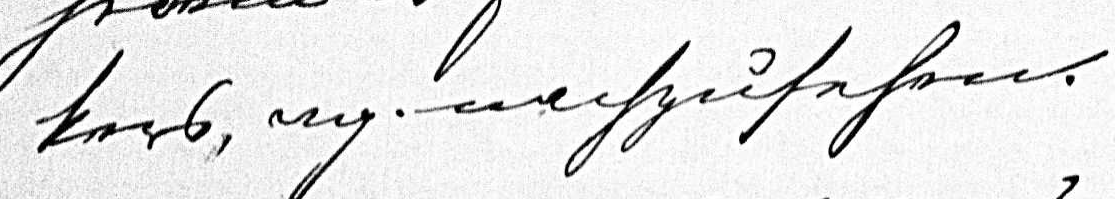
kers, ag. nachzusehen.
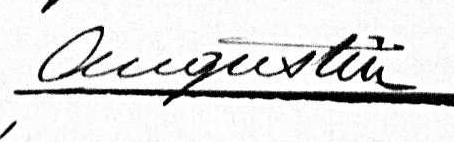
Augustin
